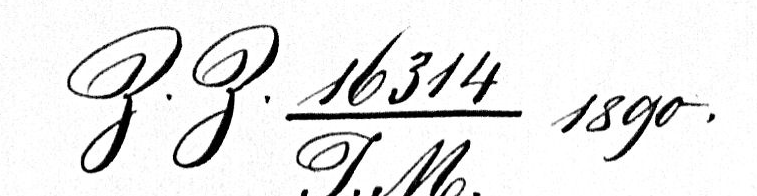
Z.Z. 16314/ 1890.
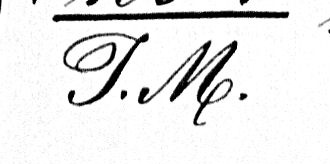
J.M.
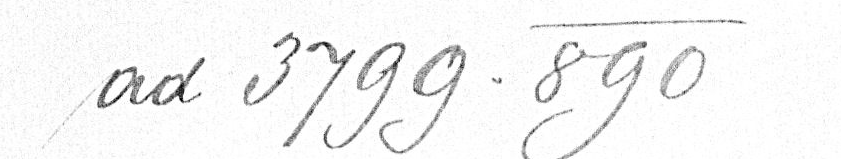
ad 3799.890
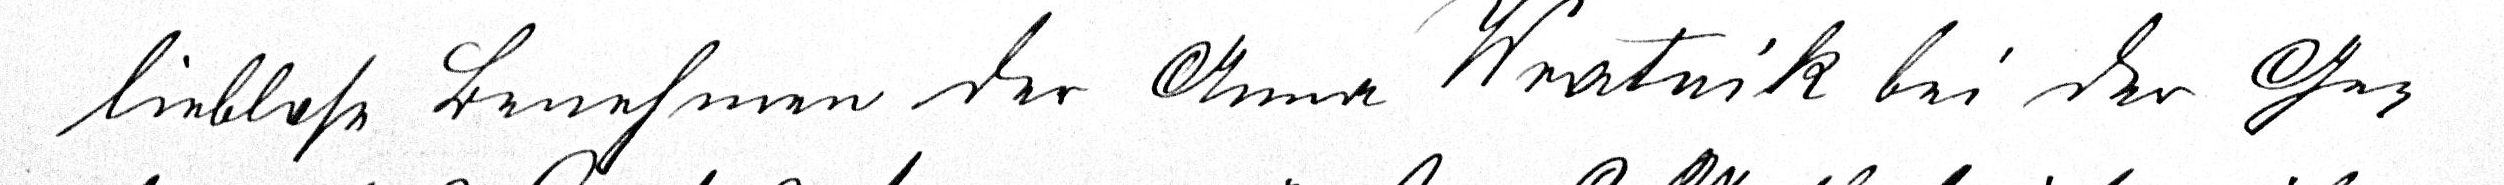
lieblose Benehmen der Anna Wratnik bei der Ge¬
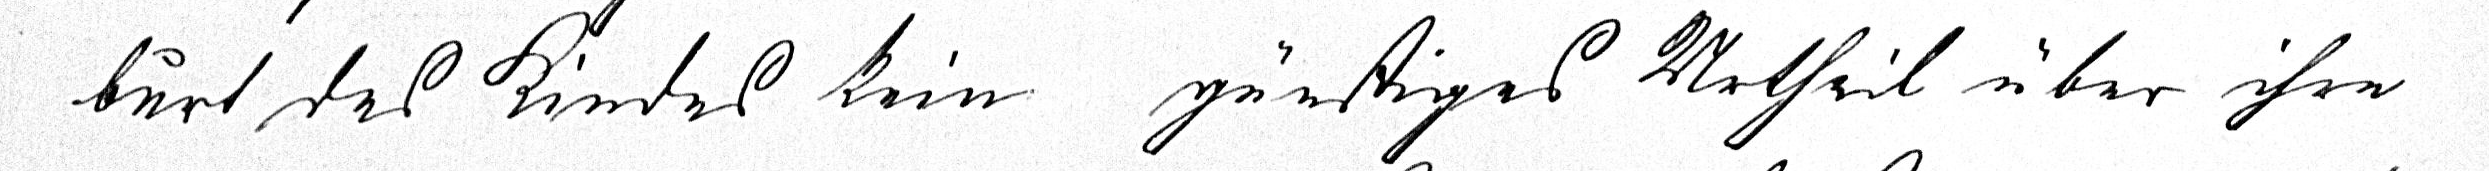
burt des Kindes kein günstiges Urtheil über ihre
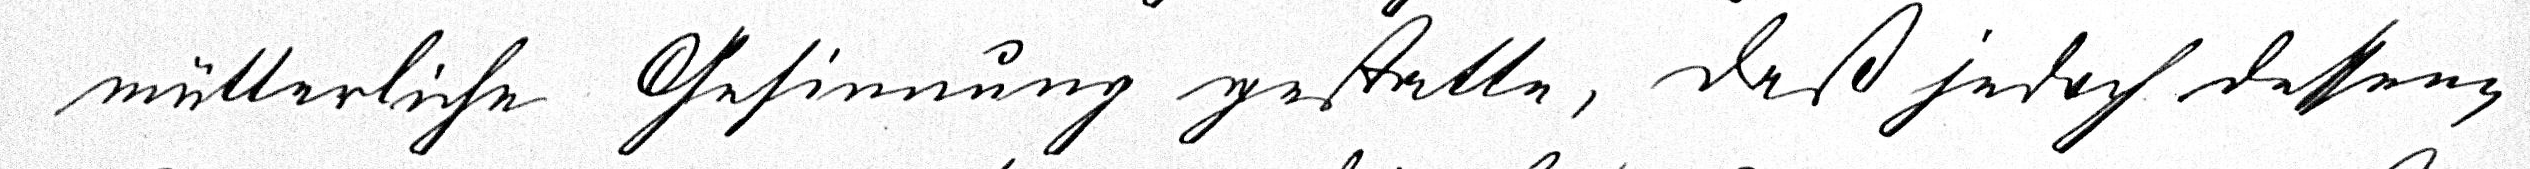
mütterliche Gesinnung gestatte, daß jedoch dessen¬
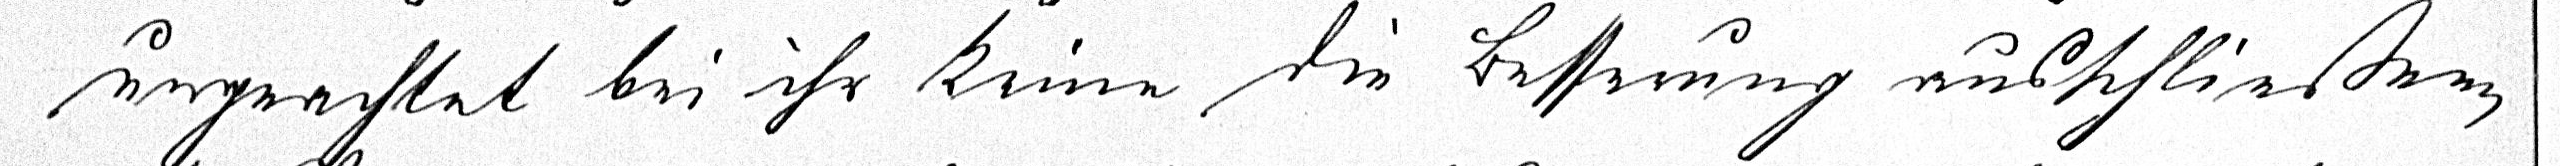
ungeachtet bei ihr keine die Besserung ausschließen¬
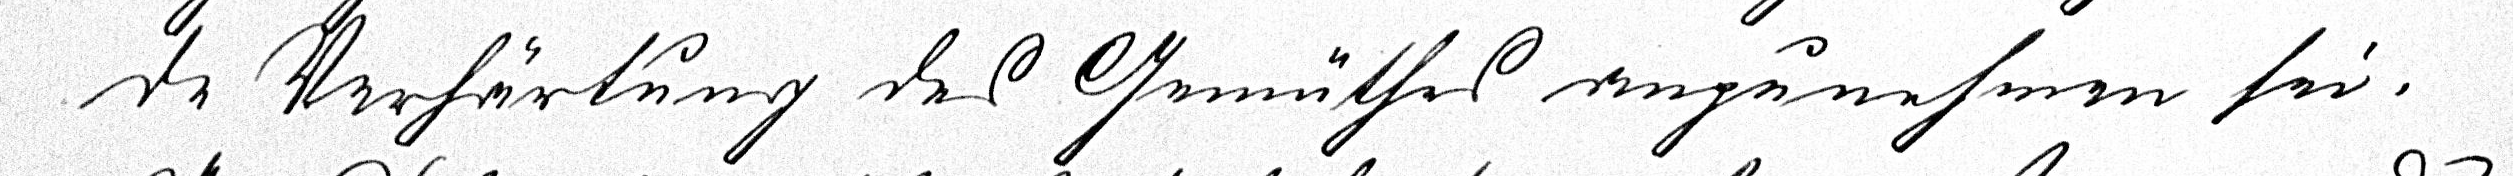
de Verhärtung des Gemäthes anzunehmen sei.
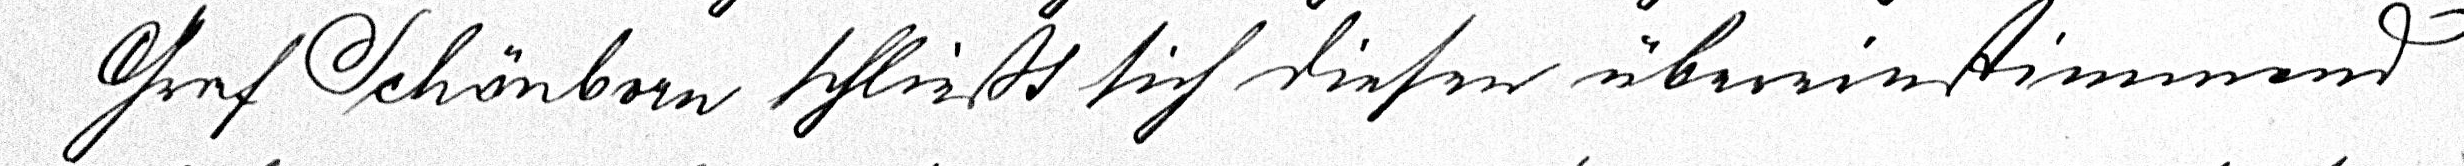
Graf Schöborn Schönborn schließt sich diesen übereinstimmend
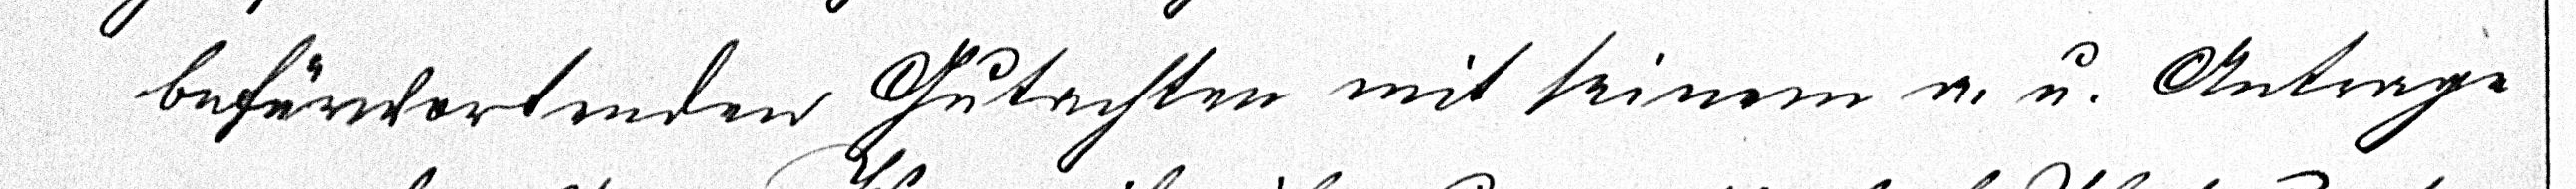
befürwortenden Gutachten mit seinem a. u. Antrage
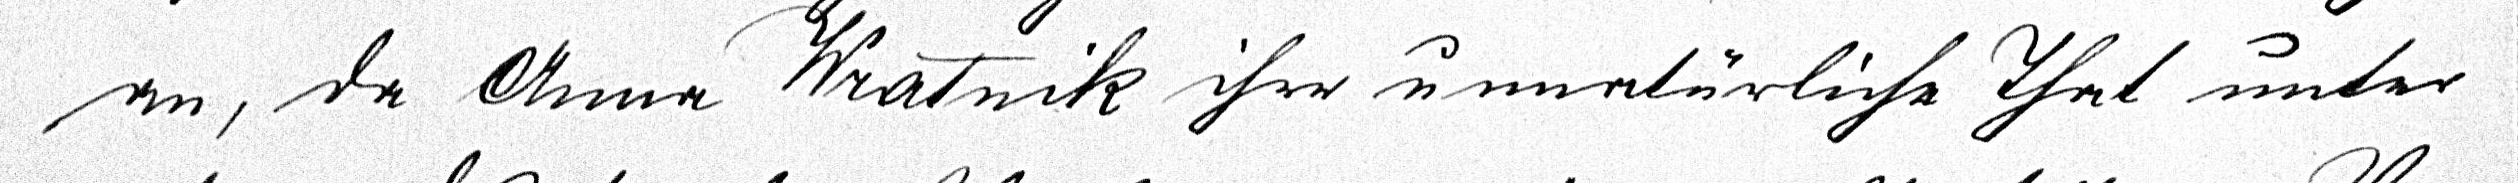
an, da Anna Wratnik ihre unnatürliche That unter
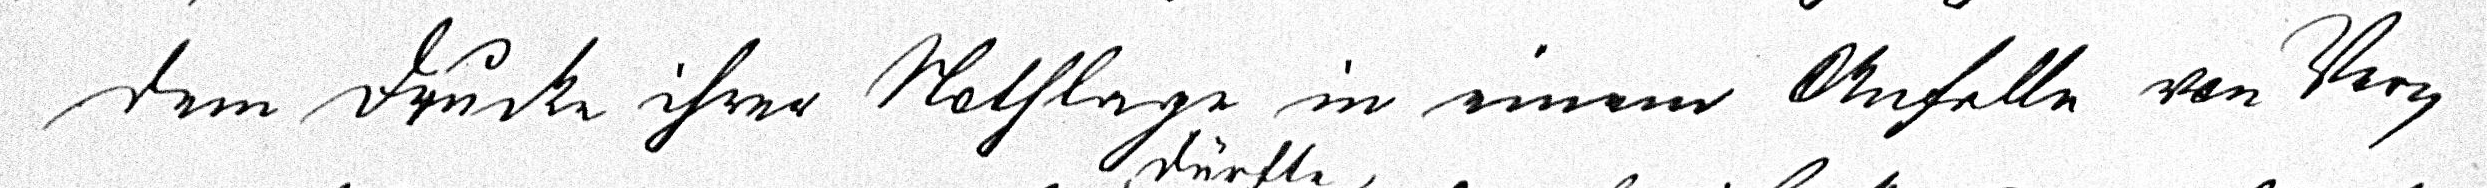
dem Drucke ihrer Nothlage in einem Anfelle von Ver¬
